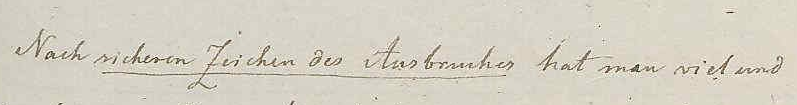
Nach sicheren Zeichen des Ausbruches hat man viel und
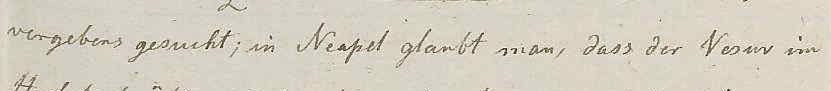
vergebens gesucht; in Neapel glaubt man, dass der Vesuv im
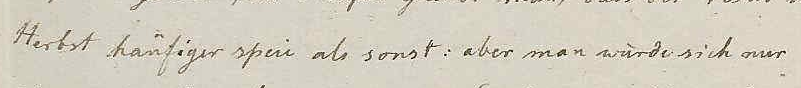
Herbst häufiger speie als sonst: aber man würde sich nur
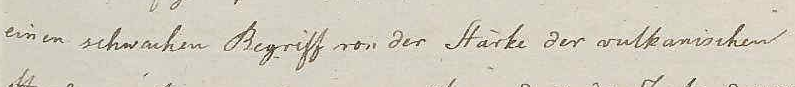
einen schwachen Begriff von der Stärke der vulkanischen
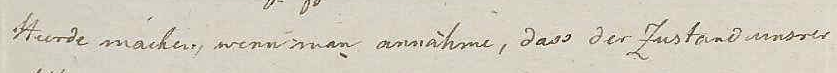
Heerde machen, wenn man annähme, dass der Zustand unsrer
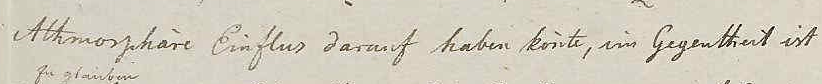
Athmosphäre Einflus darauf haben könte, im Gegentheil ist
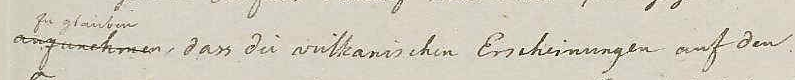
anzunehmenzu glauben, dass die vulkanischen Erscheinungen auf den
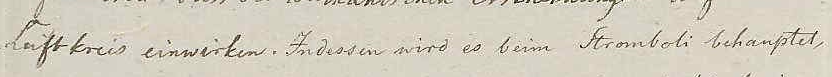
Luftkreis einwirken. Indessen wird es beim Stromboli behauptet,
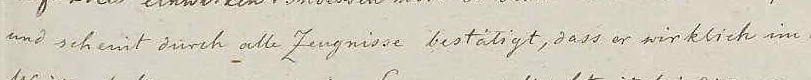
und scheint durch alle Zeugnisse bestätigt, dass er wirklich im
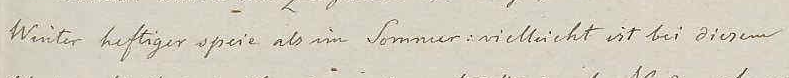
Winter heftiger speie als im Sommer: vielleicht ist bei diesem
